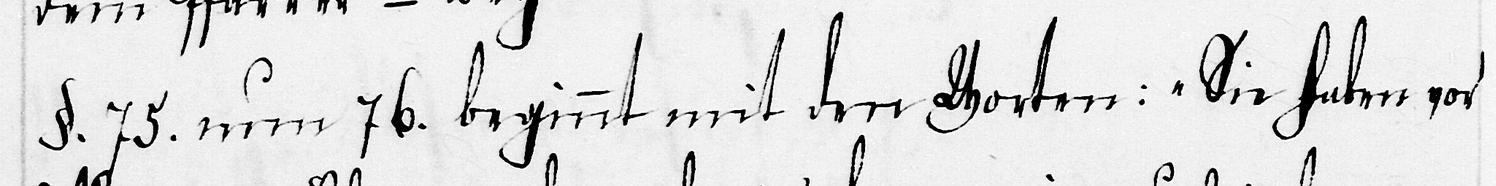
§. 75. nun 76. beginnt mit den Worten: „Sie haben vor
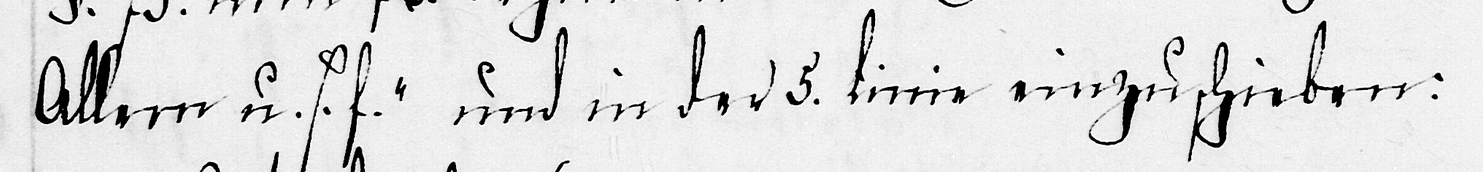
Allem u. s. f.“ und in der 5. Linie einzuschieben:
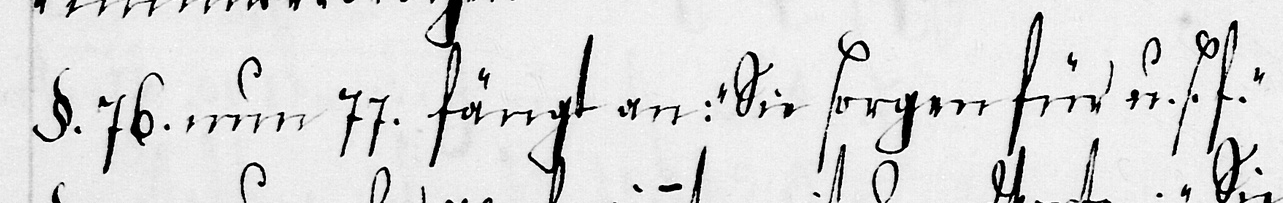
§. 76. nun 77. fängt an: „Sie sorgen für u. s.
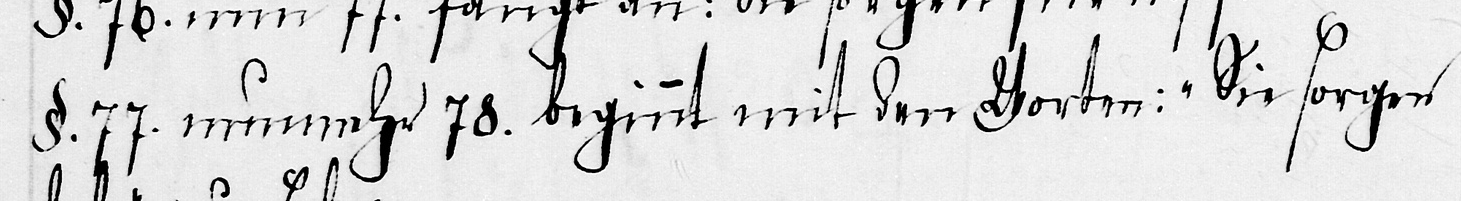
§. 77. nunmehr 78. beginnt mit den Worten: „Sie sorgen
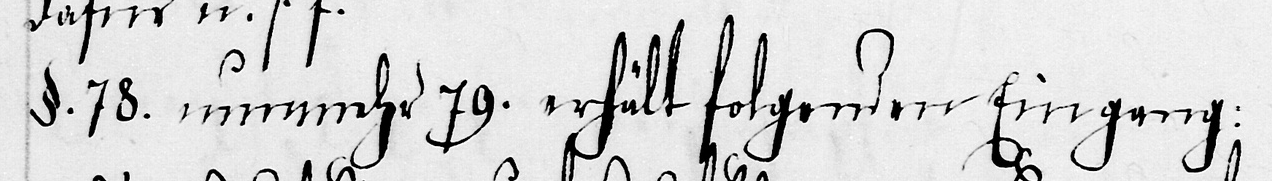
§. 78. nunmehr 79. erhält folgenden Eingang:
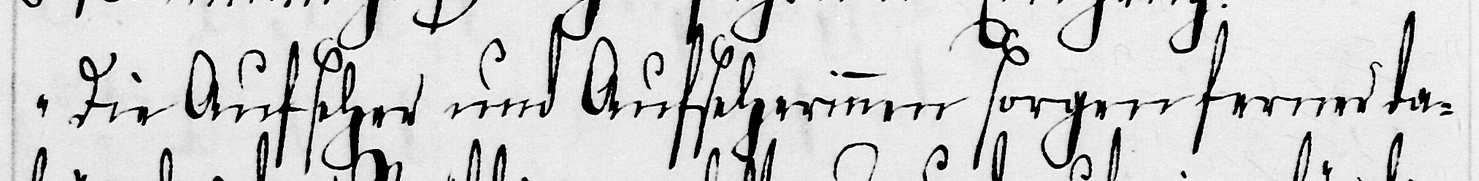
„Die Aufseher und Aufseherinnen sorgen ferner da¬
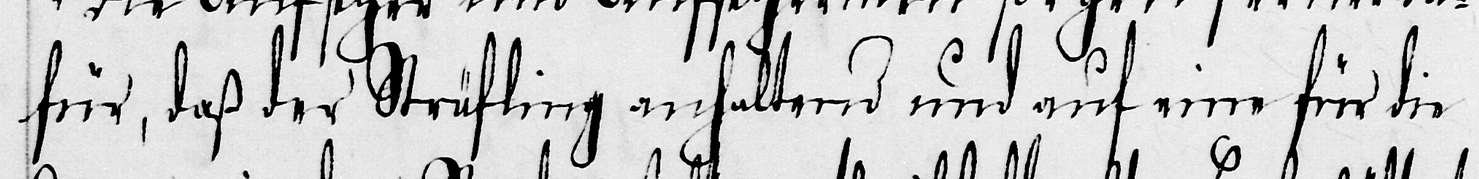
für, daß der Sträfling anhaltend und auf eine für die
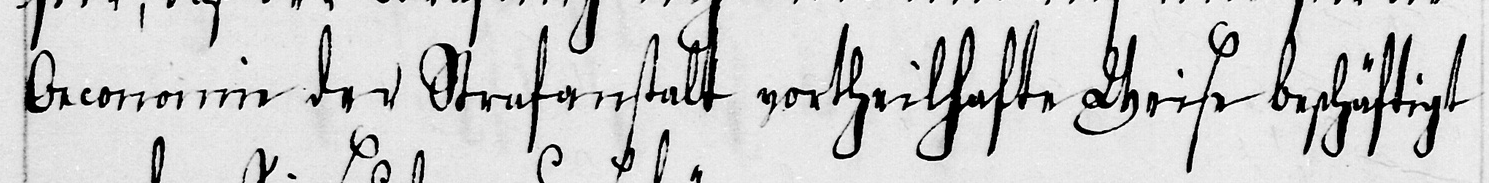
Oeconomie der Strafanstalt vortheilhafte Weise beschäftigt
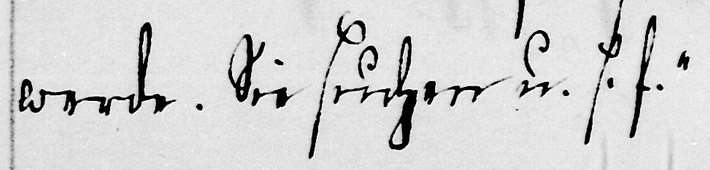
werde. Sie suchen u. s. f.“
